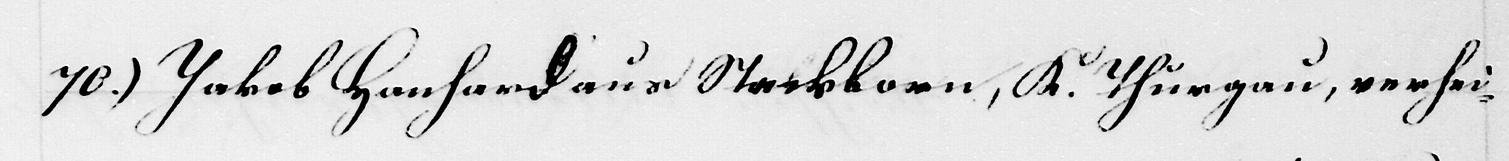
70.) Jakob Hanhard aus Steckborn, K. Thurgau, verhei¬
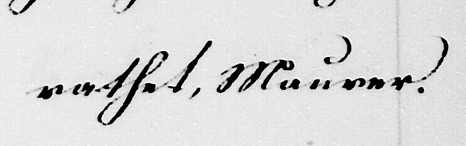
rathet, Maurer.
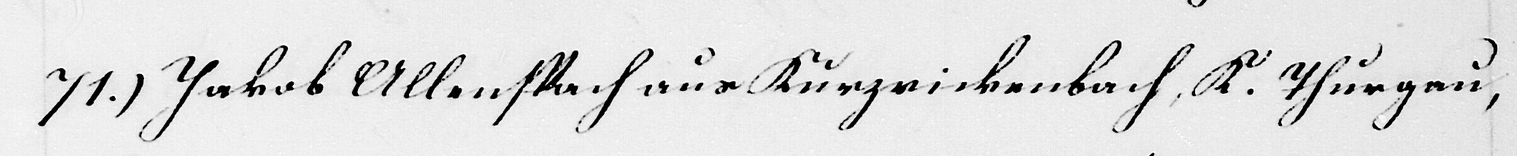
71.) Jakob Allenspach aus Kurzrickenbach, K. Thurgau,
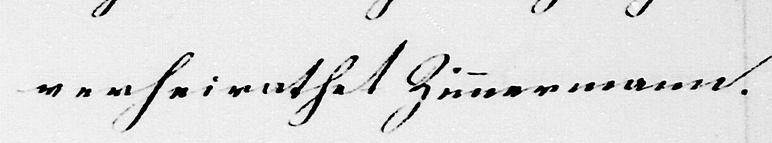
verheirathet Zimmermann.
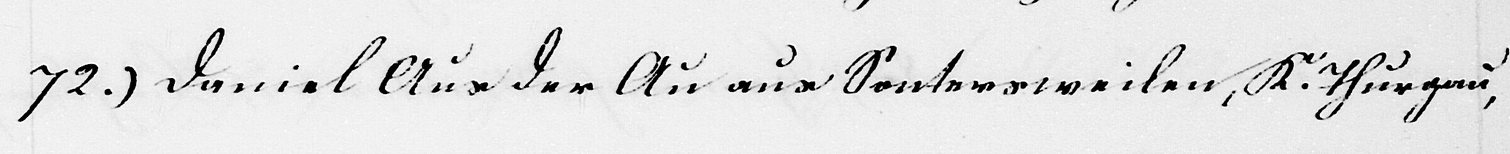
72.) Daniel Aus der Au aus Sontersweilen, K. Thurgau,
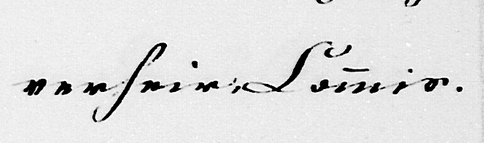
verheir. Commis.
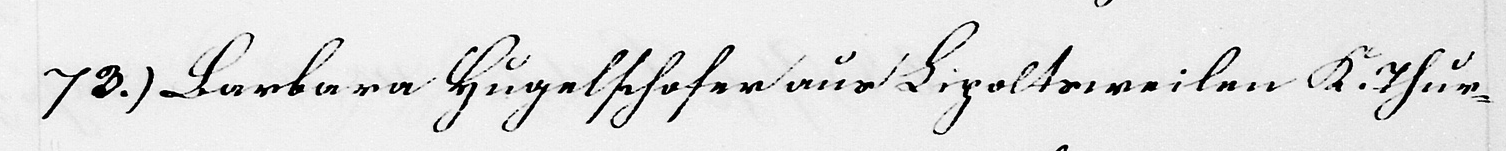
73.) Barbara Hugelschofer aus Lipoltsweilen K. Thur¬
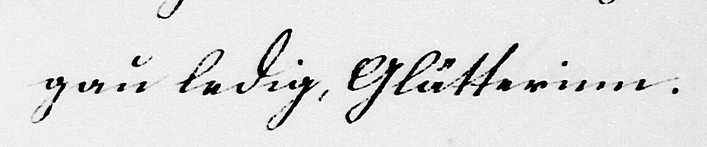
gau ledig, Glätterinn.
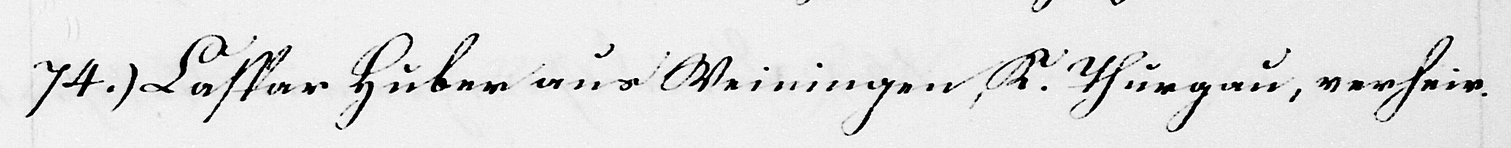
74.) Caspar Huber aus Weiningen, K. Thurgau, verheir.
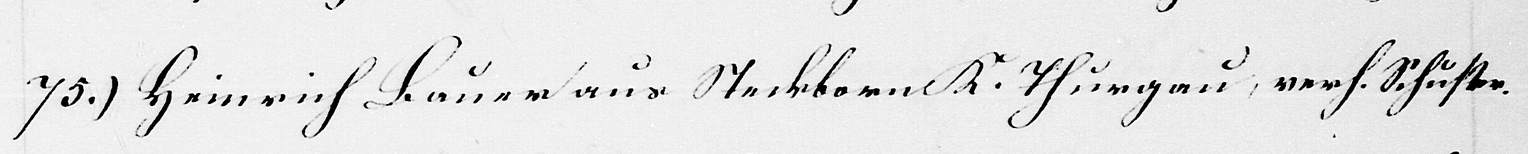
75.) Heinrich Bauer aus Steckborn K. Thurgau, verh. Schuster.
